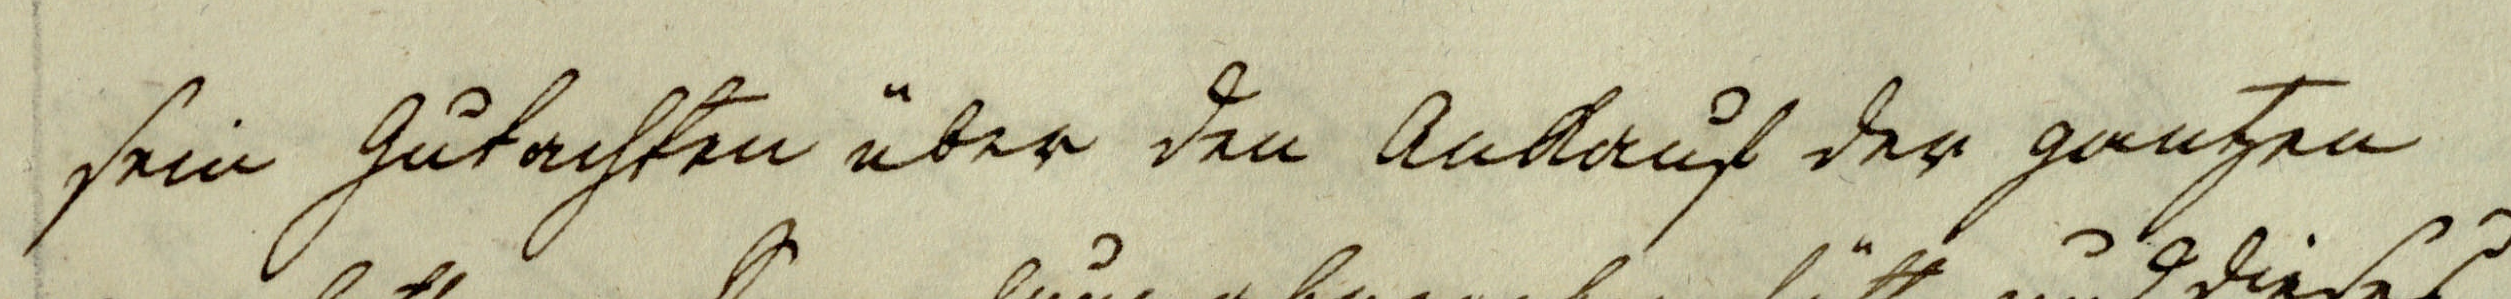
sein Gutachten über den Ankauf der gantzen
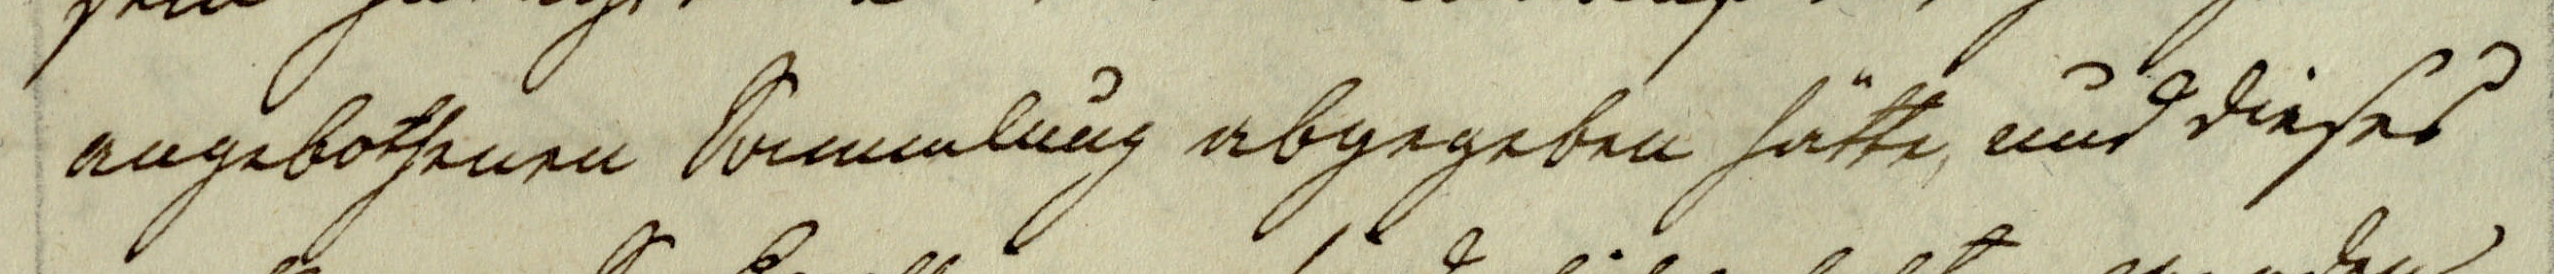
angebothenen Sammlung abgegeben hätte und dieses
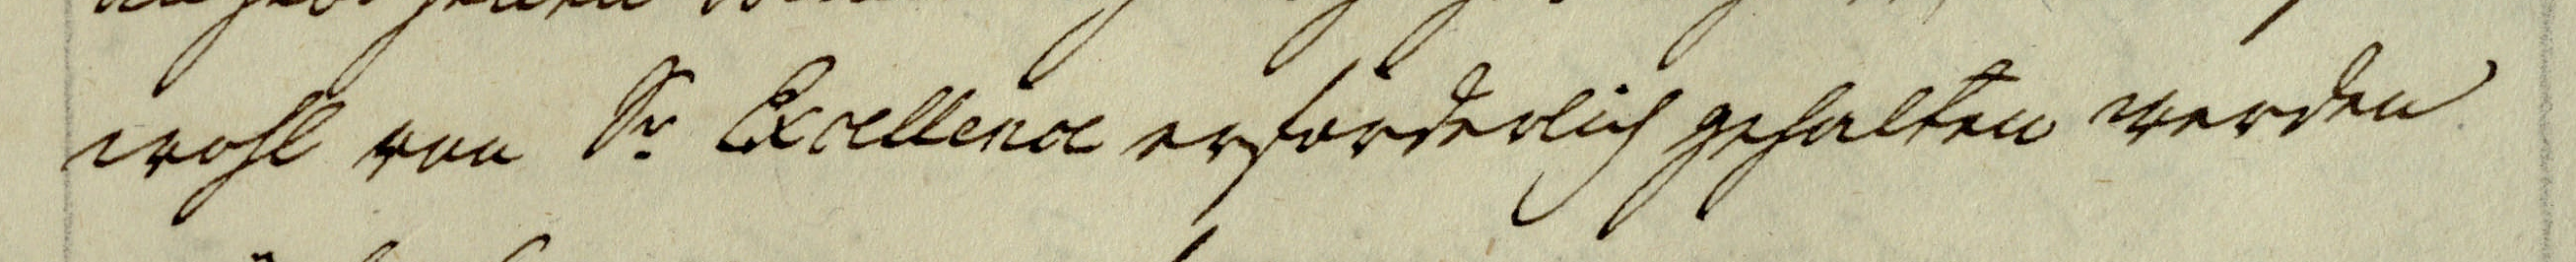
wohl von Sr Excellence erforderlich gehalten werden
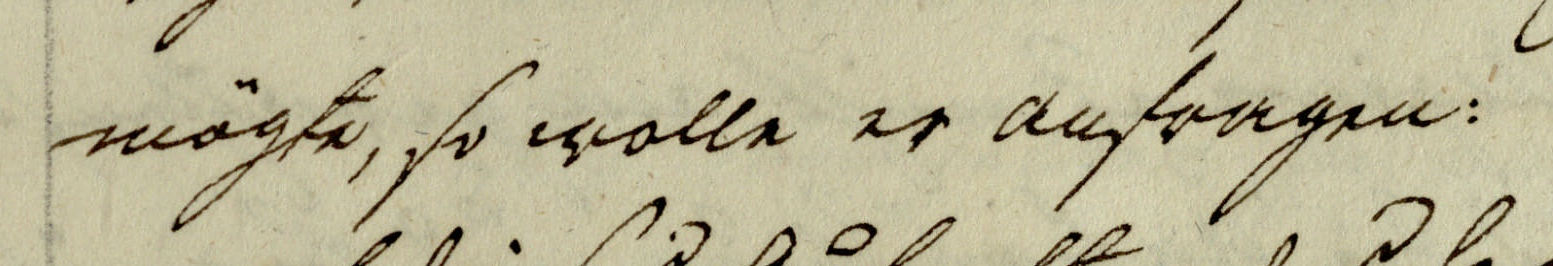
mögte, so wolle er anfragen:
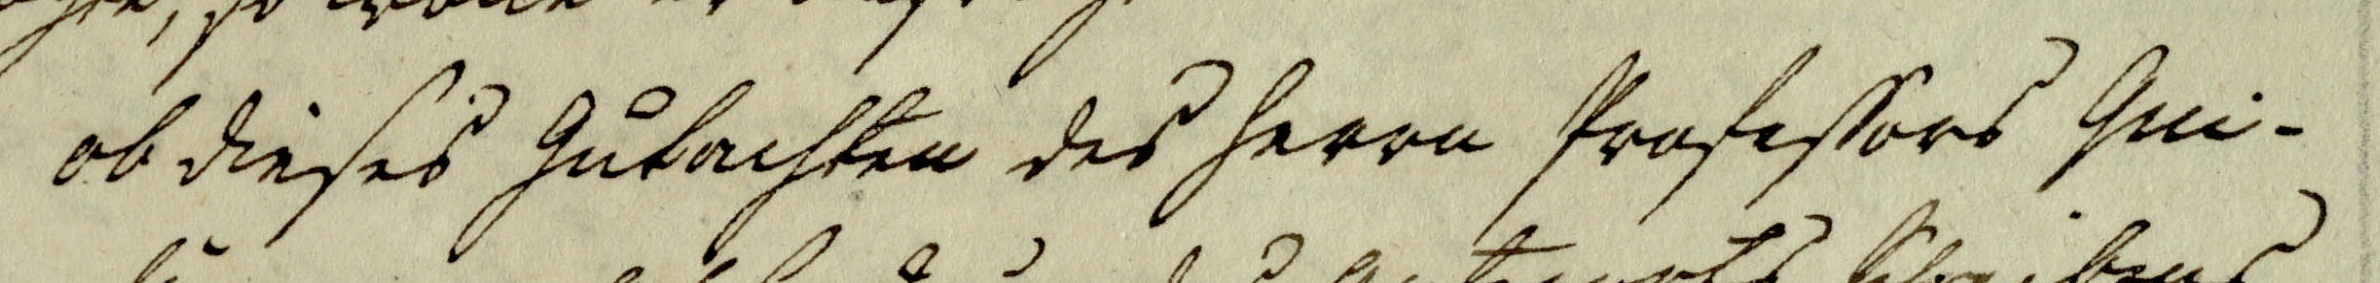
ob dieses Gutachten des Herrn Professors Qui¬
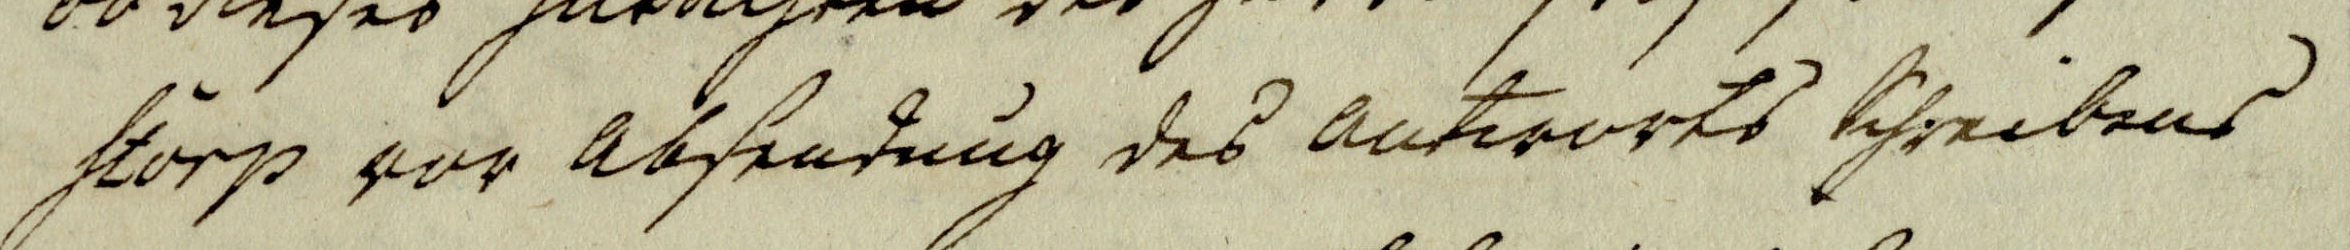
storp vor Absendung des Antworts Schreibens
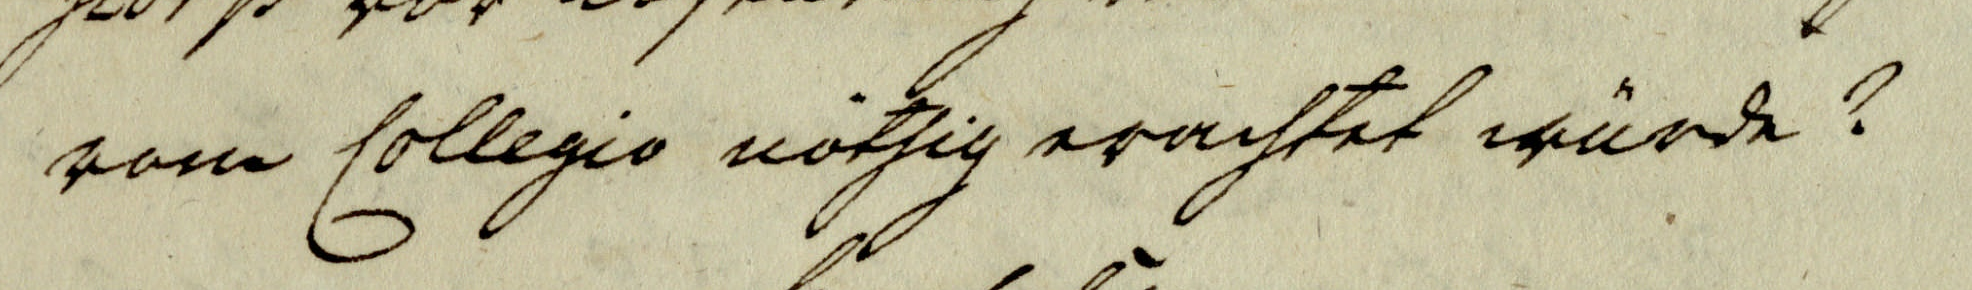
vom Collegio nöthig erachtet würde?
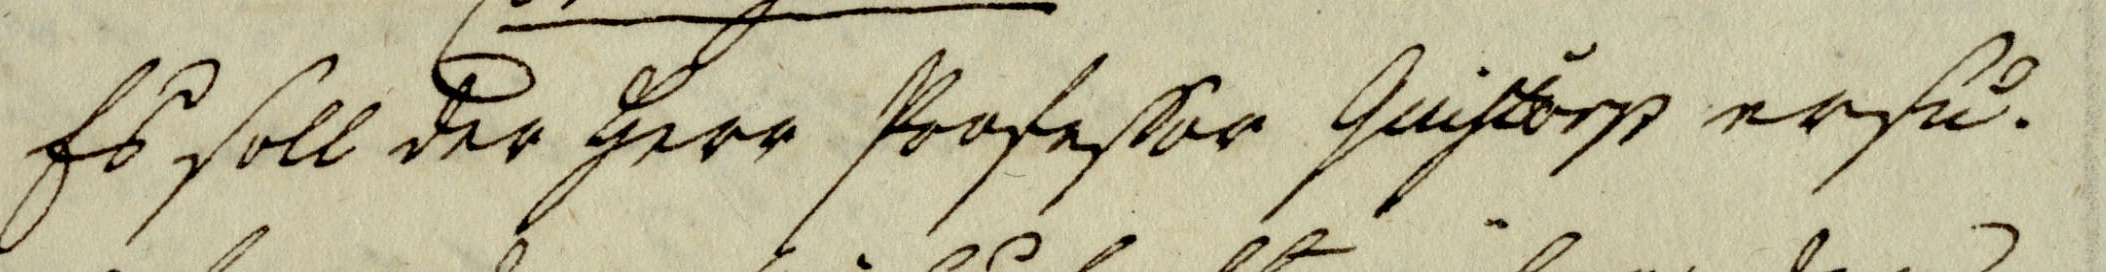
Es soll der Herr Professor Quistorp ersu¬
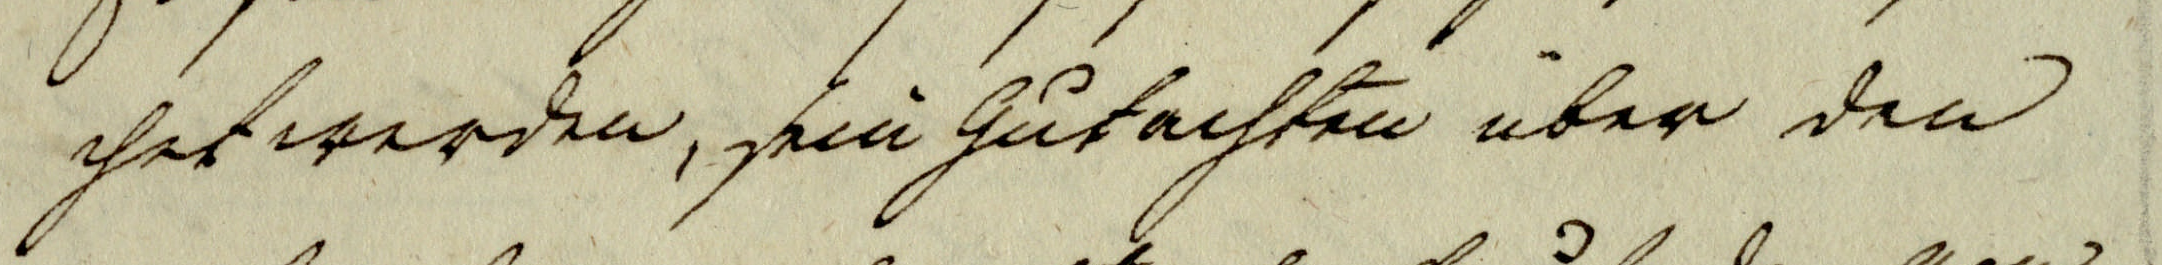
chet werden, sein Gutachten über den
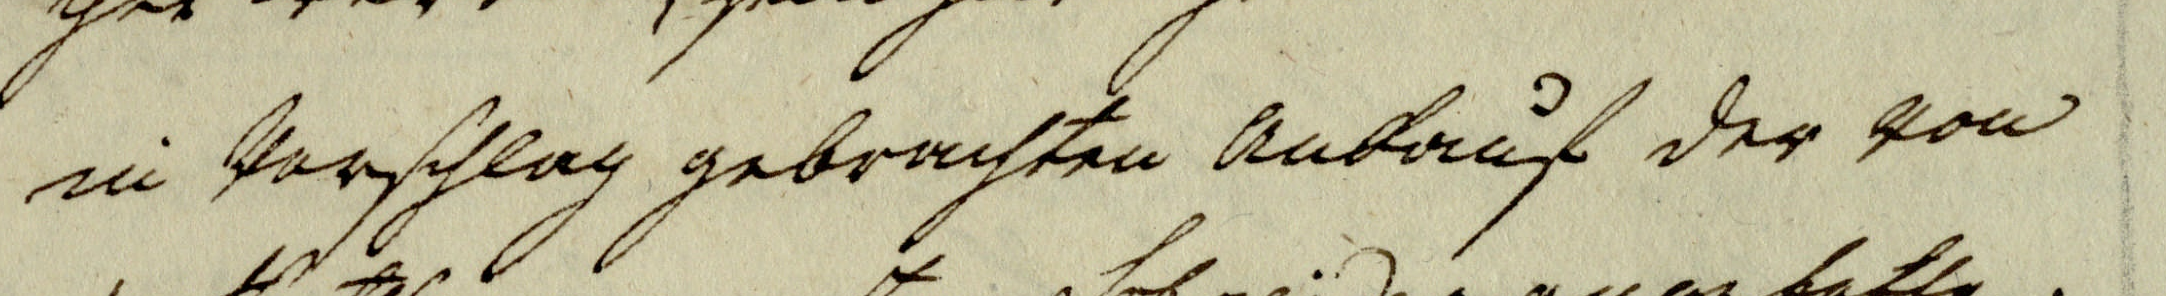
in Vorschlag gebrachten Ankauf der von
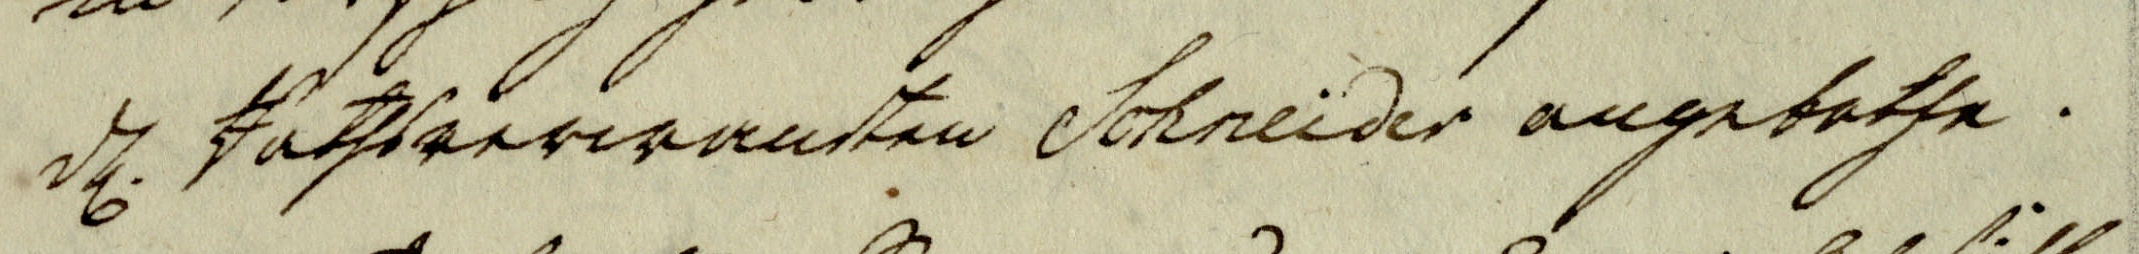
dh. Rathsverwandten Schneider angebothe¬
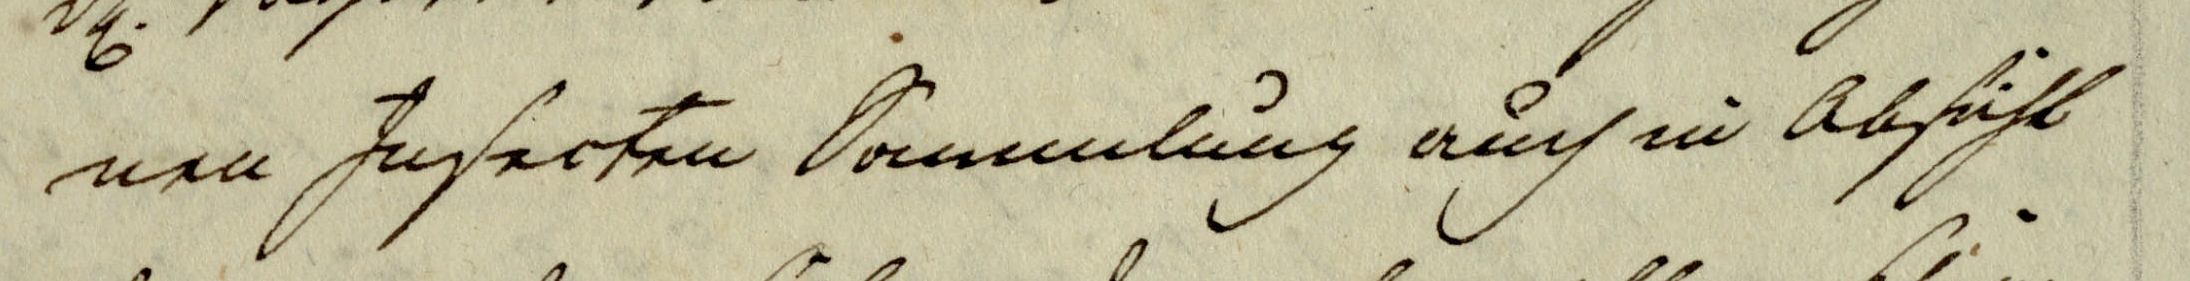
nen Insecten Sammlung auch in Absicht
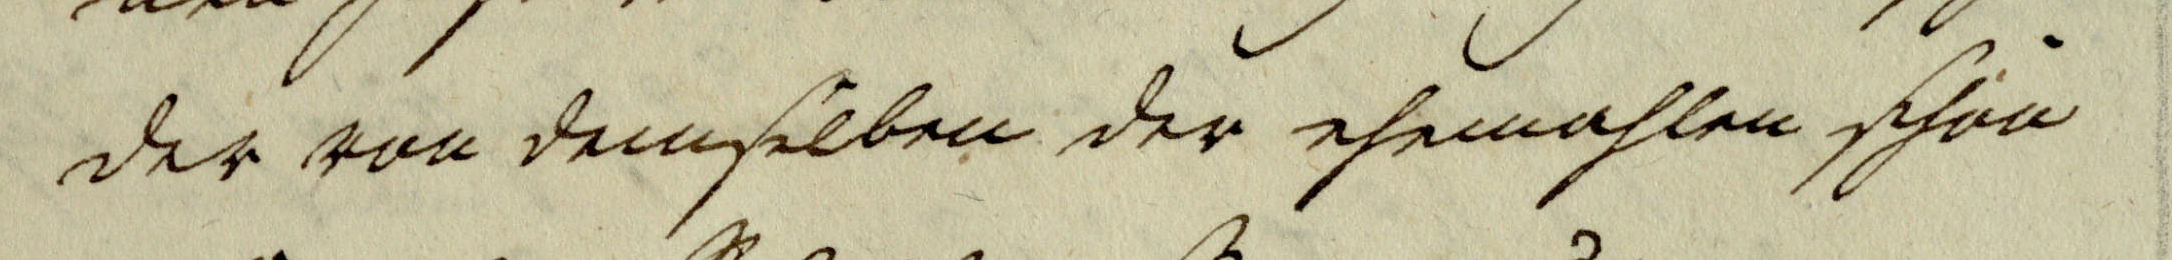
der von demselben der ehemahlen schon
